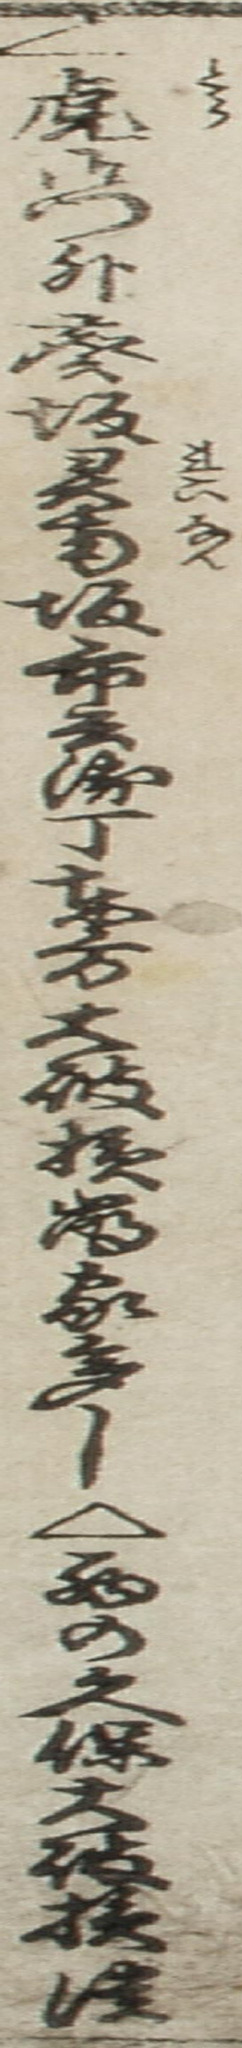△虎御門外葵坂霊南坂市兵衛丁東方大破損崩家多し△西の久保大破損潰
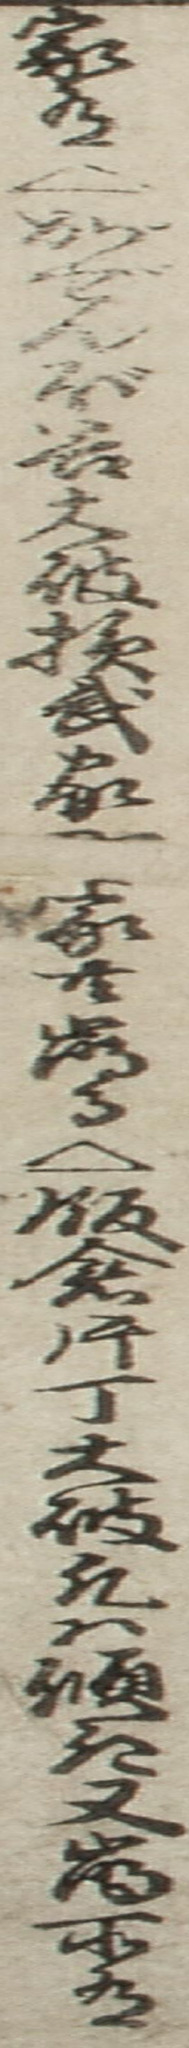家有△かぜんぼ谷大破損武家町？家共崩る△飯倉片丁凡は傾き又崩所有

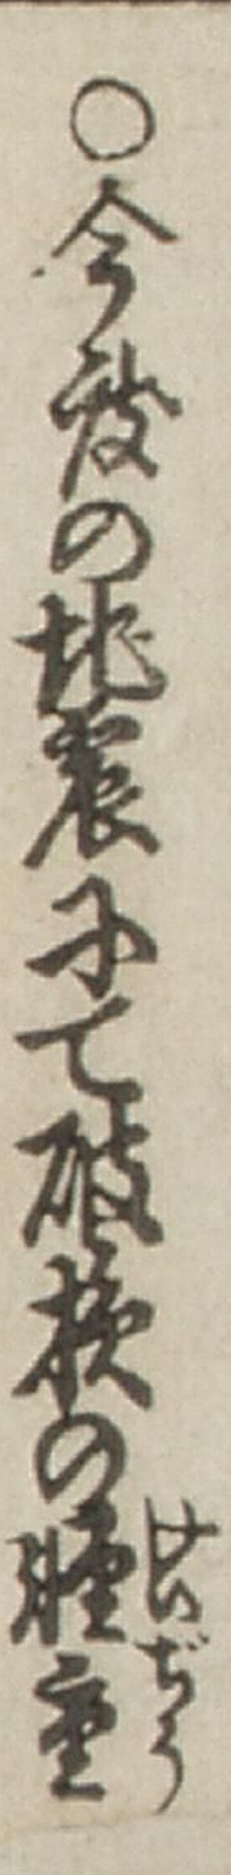〇今度の地震にて破損の軽重
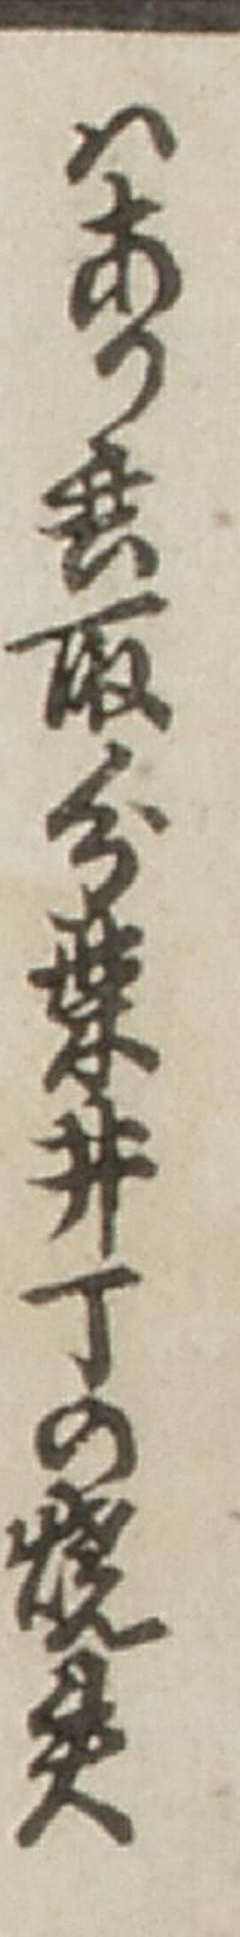はあり共取分柴井丁の焼失
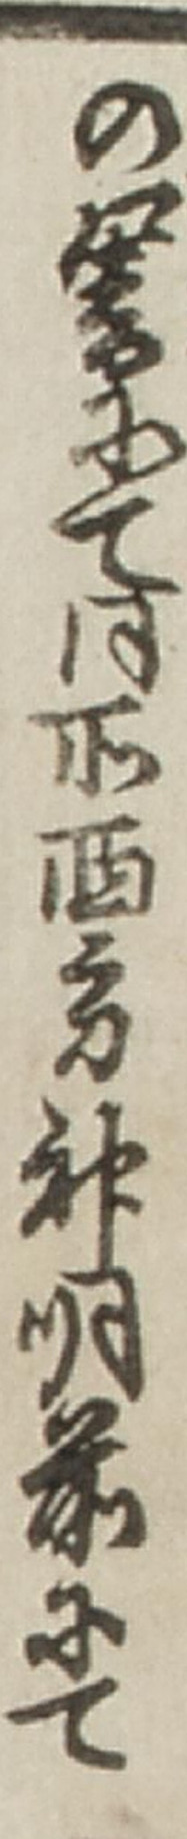の響にて同所西方神明前にて
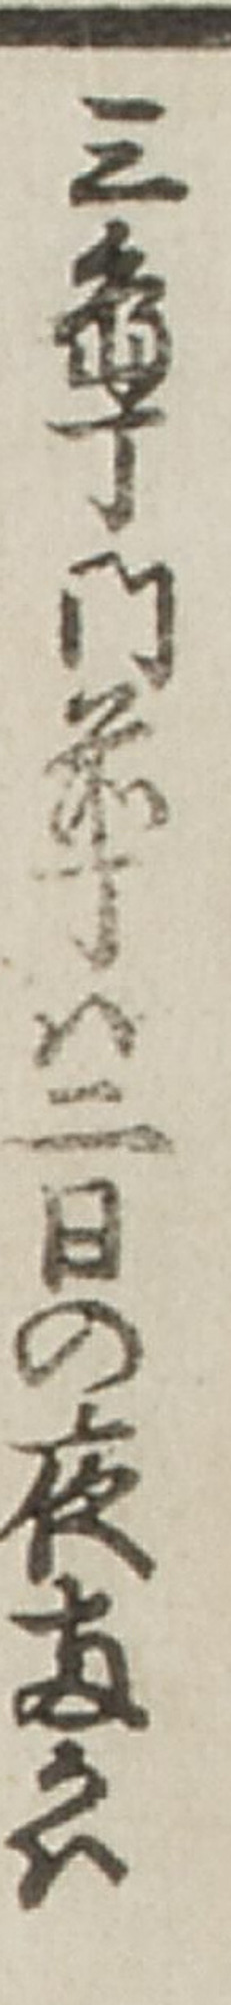三島丁門前丁は二日の夜両かは
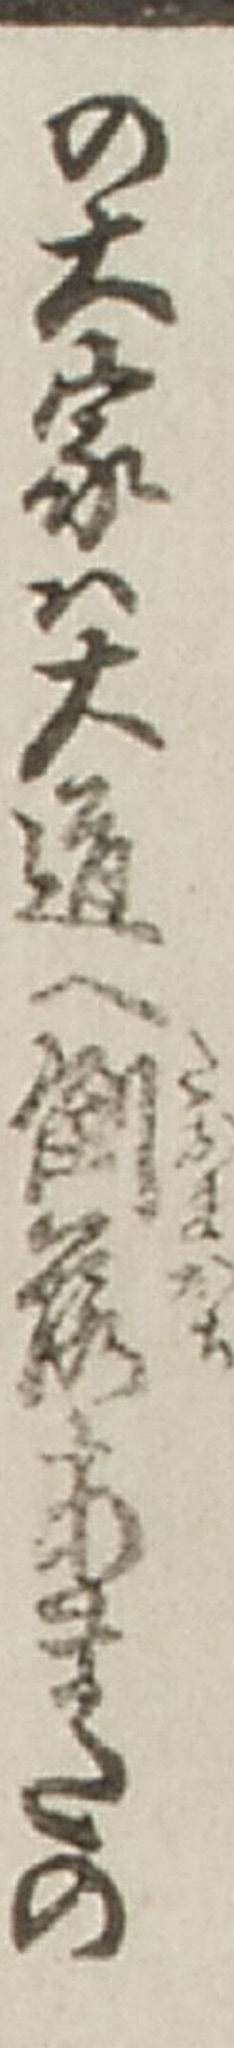の大家は大道へ倒落あまたの
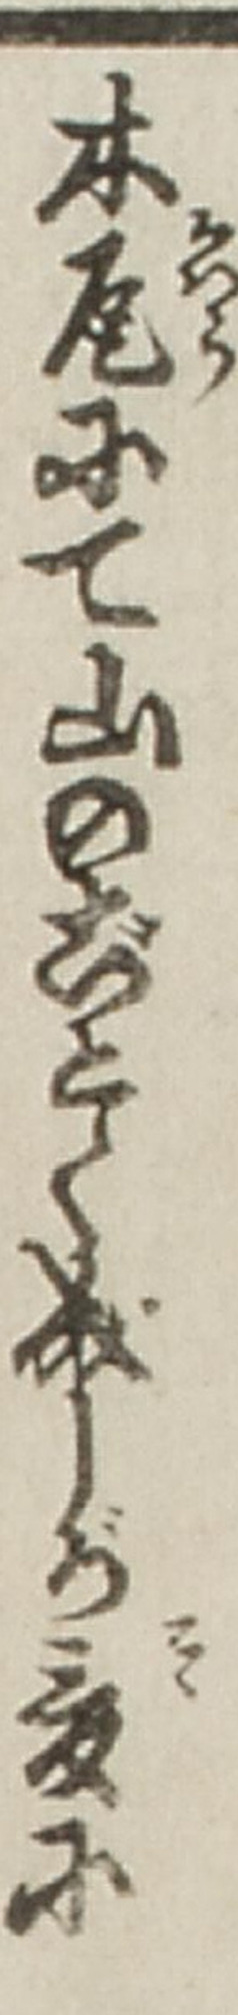木瓦にて山のごとく成しが爰に
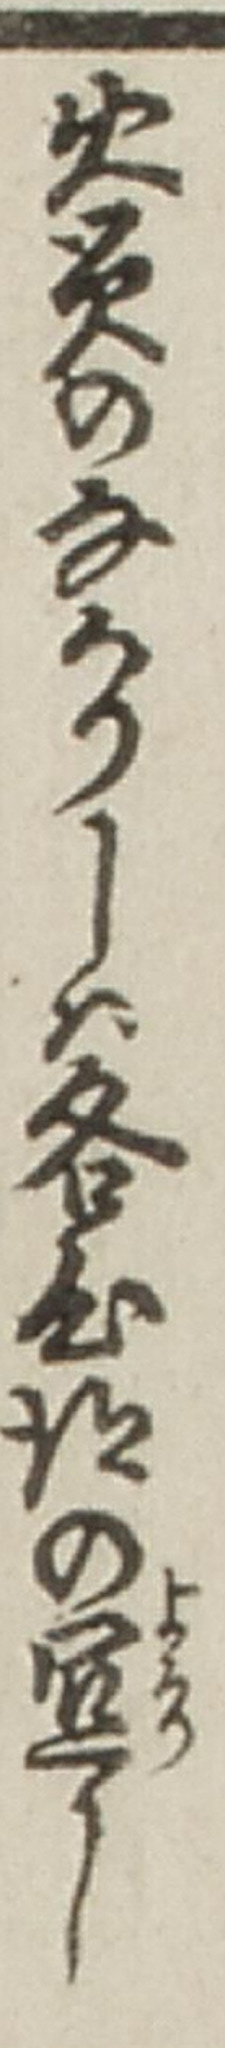火災のなかりしは各心得の宜し
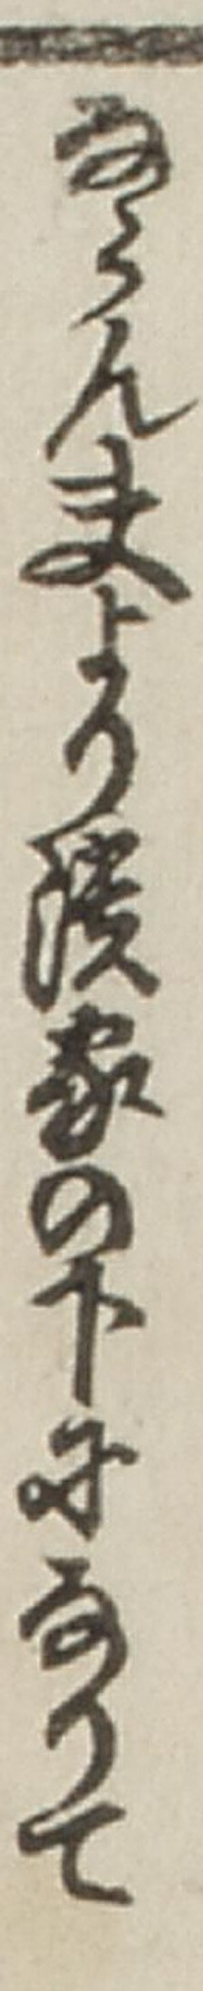ならん夫より潰家の下になりて
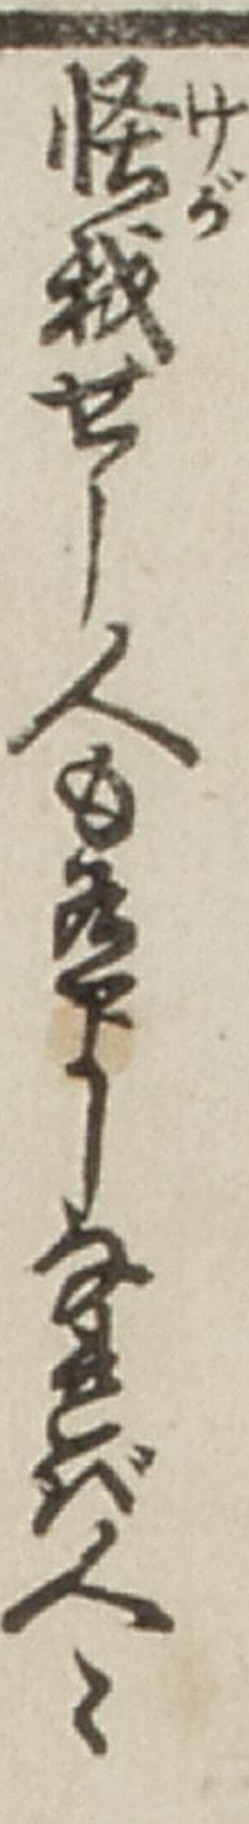怪我せし人も有よしなれば人々
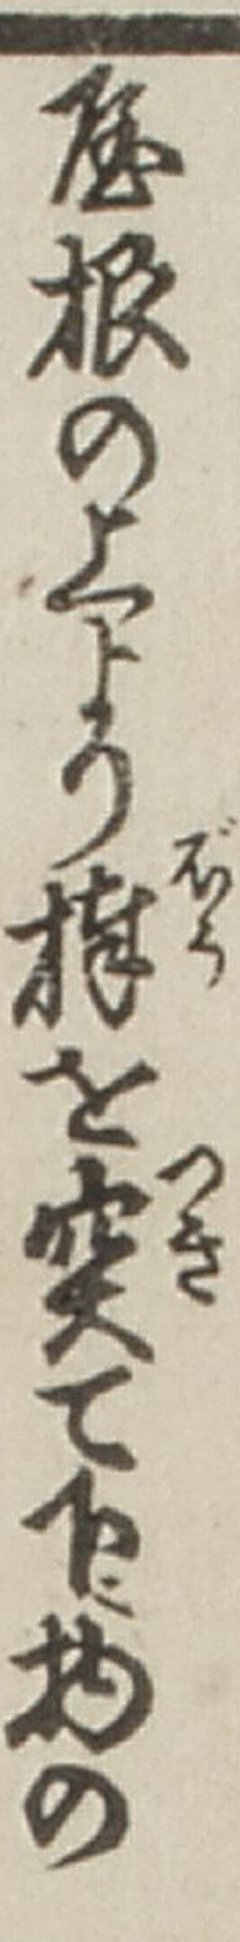屋根の上より棒を突て下に物の
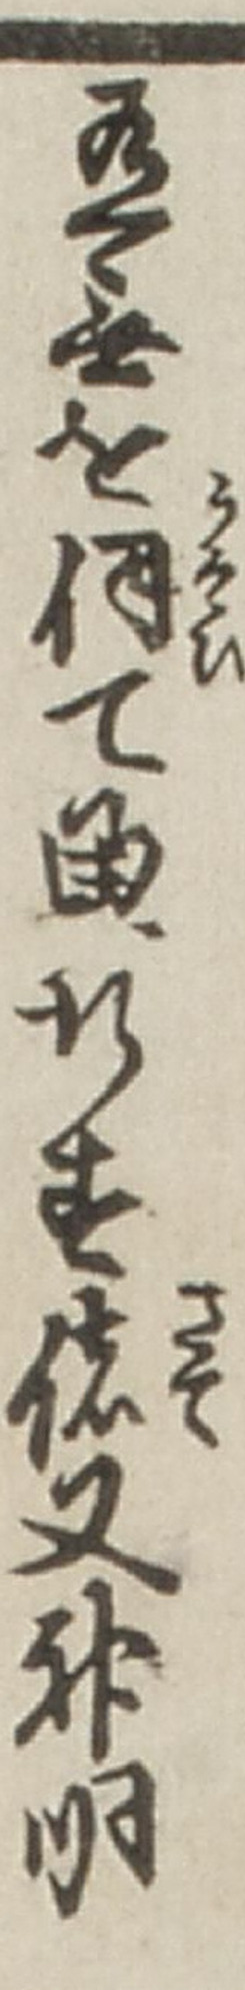有無を伺て兼行す偖又神明
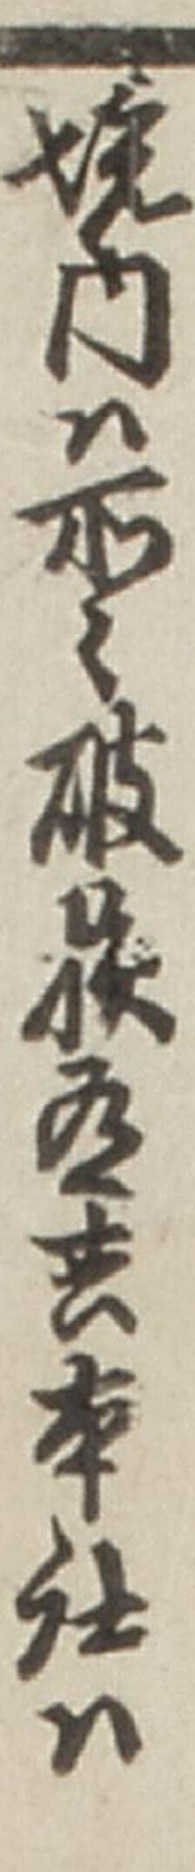境内は所々破損有共本社は
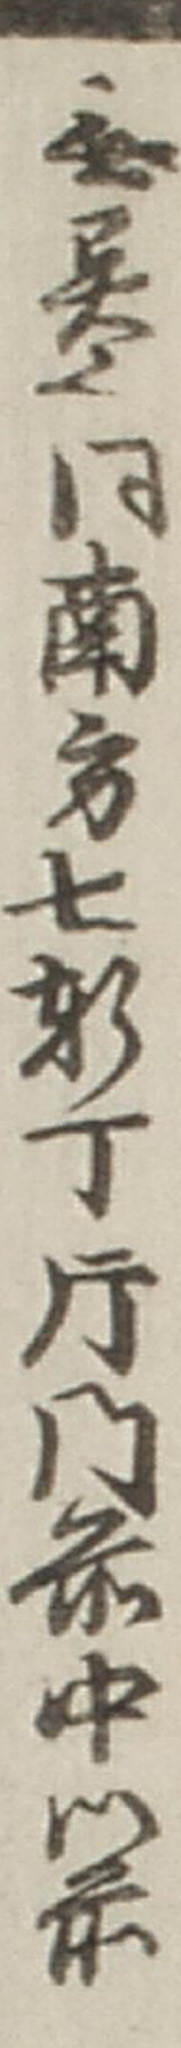無異也同南方七軒丁片門前中門前
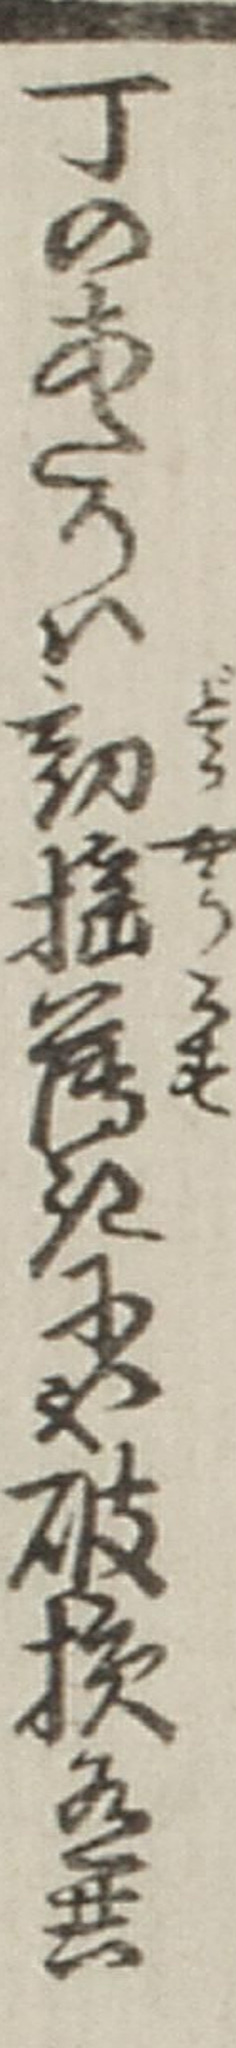丁のあたりは動揺薄きにや破損有共
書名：安政見聞誌　下
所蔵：東京大学地震研究所図書室 Earthquake Research Institute Library, The University of Tokyo, JAPAN
